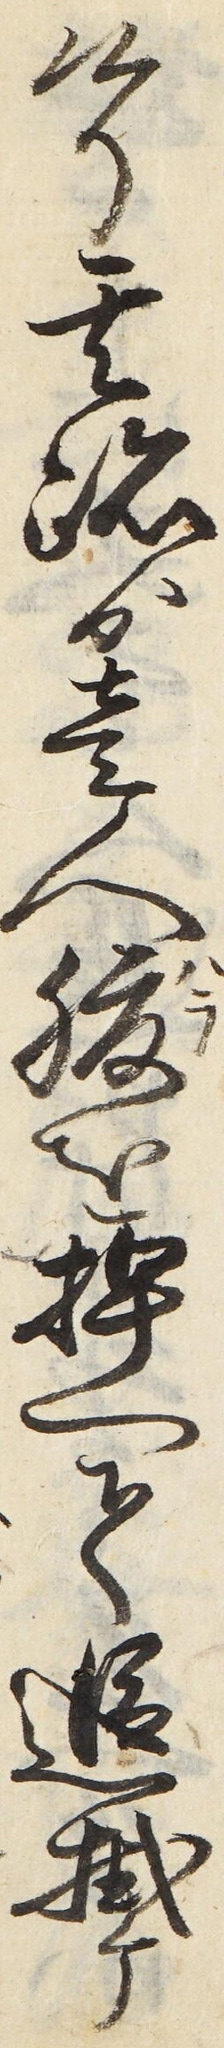けり其路ゟ壱人腹を押へて追掛け
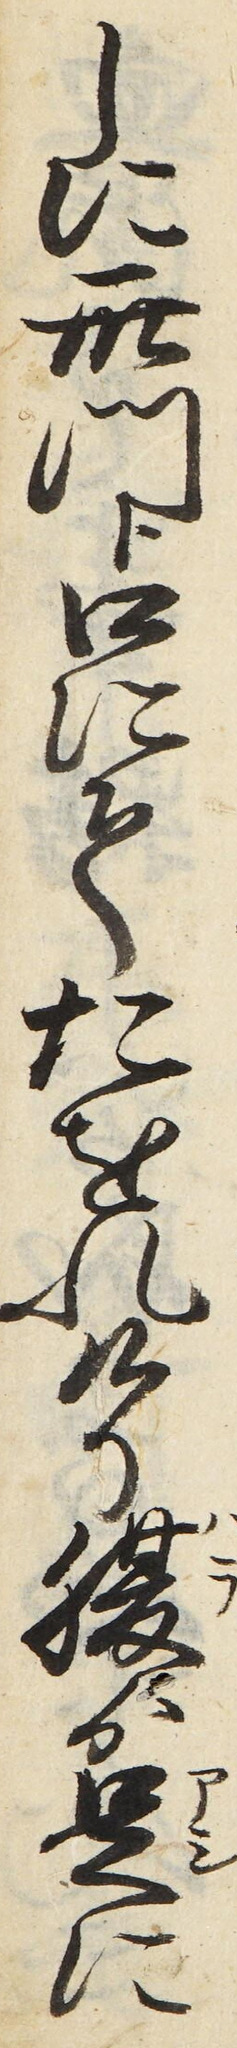しに此門と口にてたをれけり腹ゟ足に

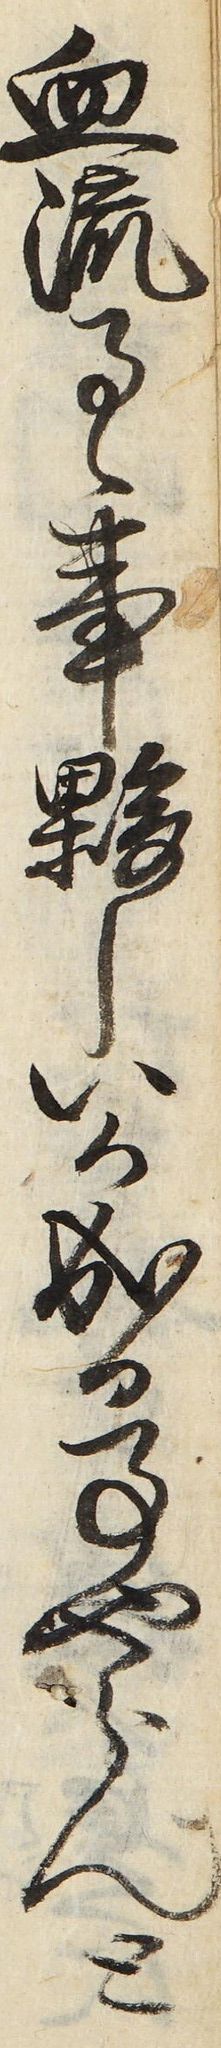血流るゝ事夥しいか成る事やらんと
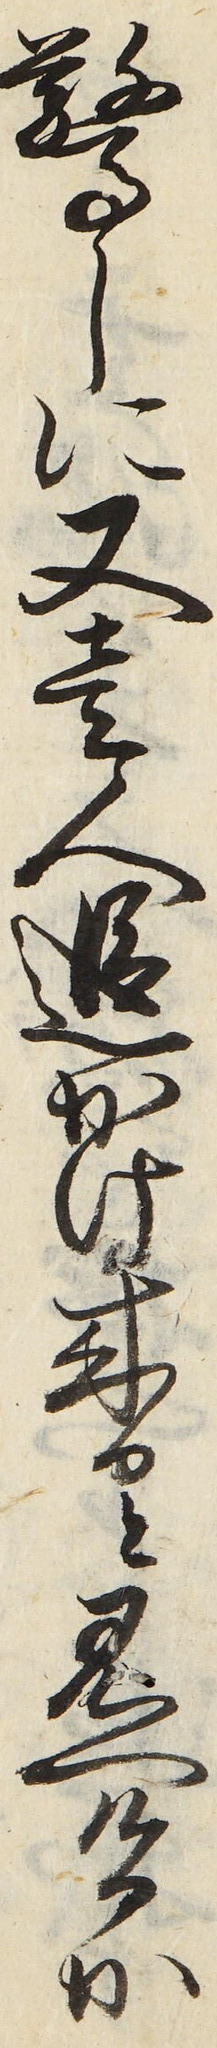驚しに又壱人追かけ来ると思へけるか
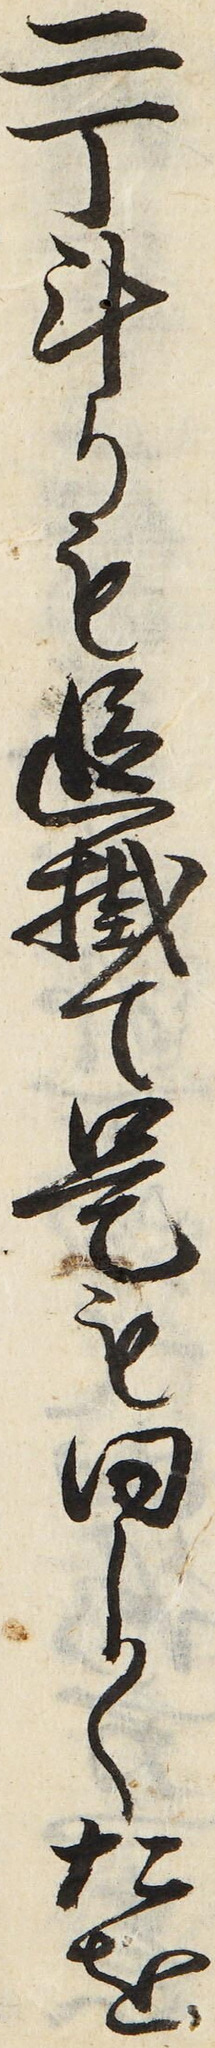二丁計りも追掛て是も同しくたを
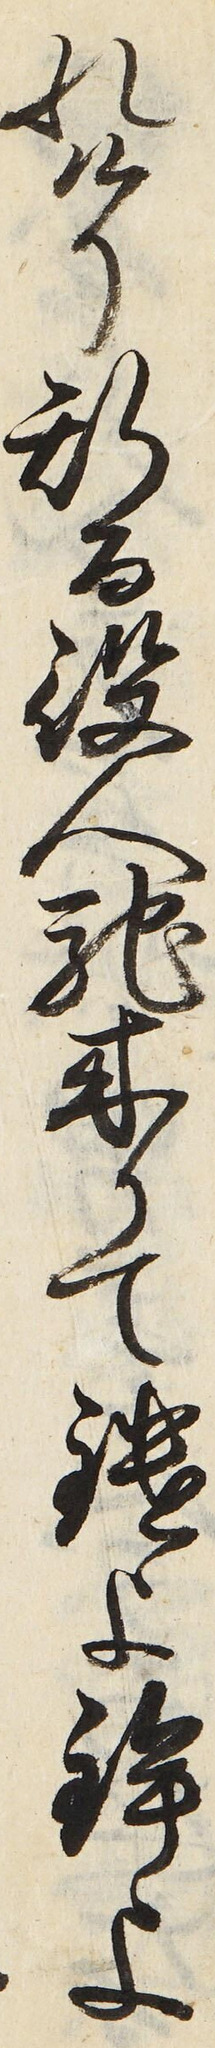れけり斯而役人馳来りて鑓よ鉾よ
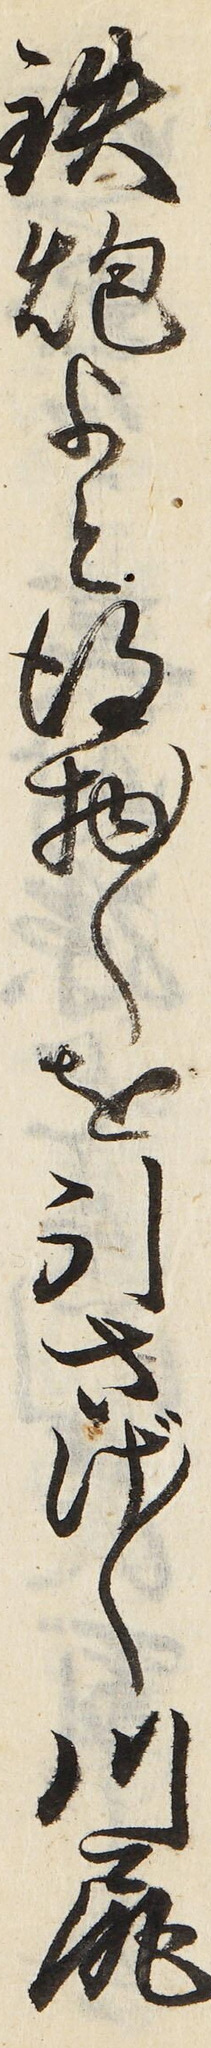鉄砲よと得物〳〵を引さげ〳〵川尻
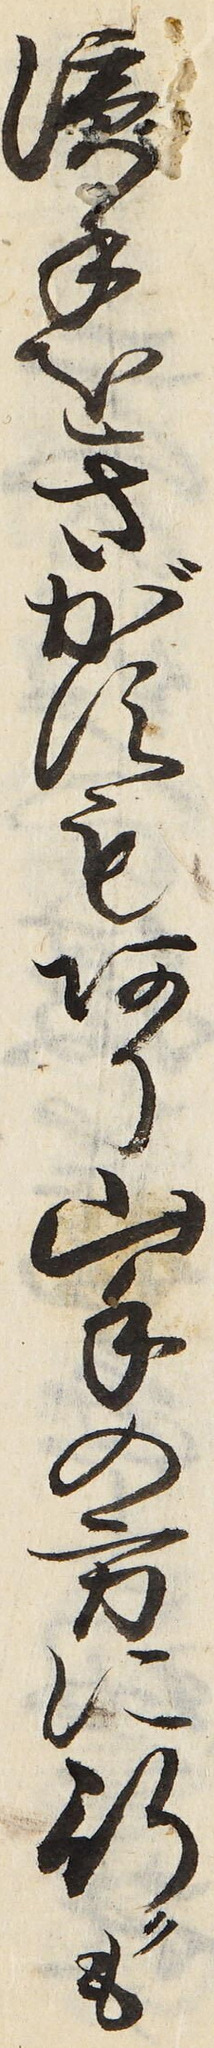浜手をさがすもあり山手の方に行くも
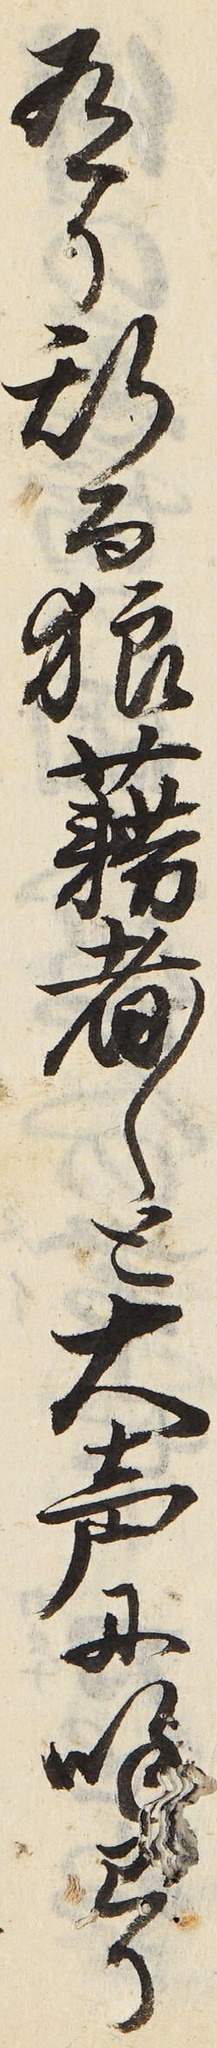有り斯而狼藉者〳〵と大声に呼わり
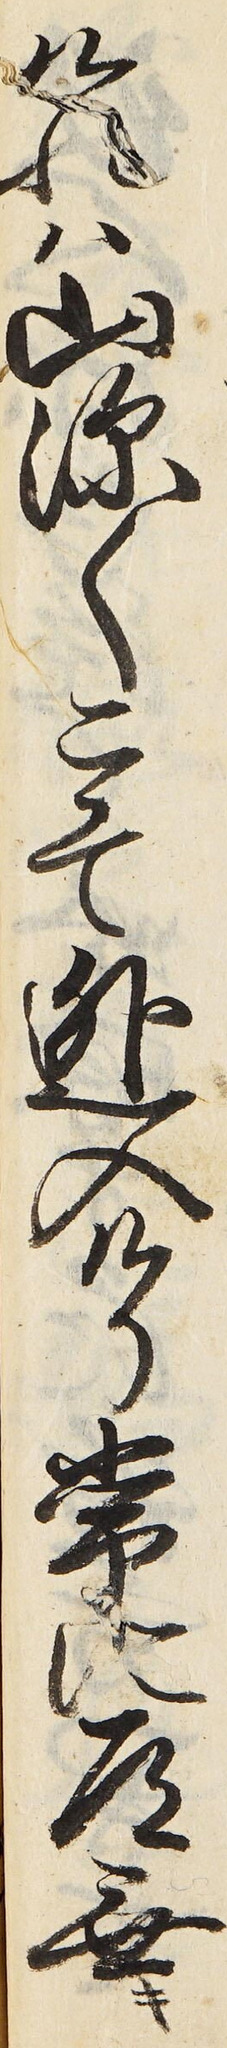けれは山深くこそ逃入けり常に道無き
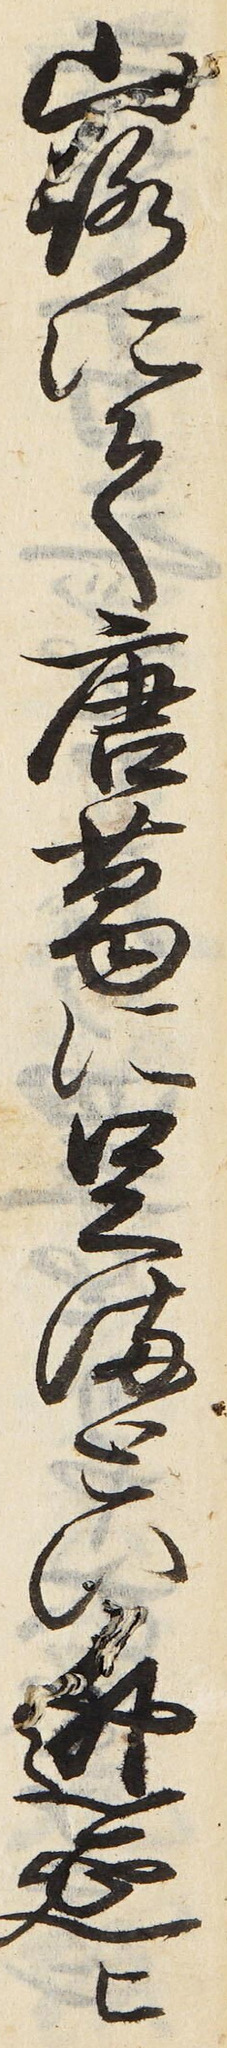山路にて唐葛に足まとひ逃延ひ
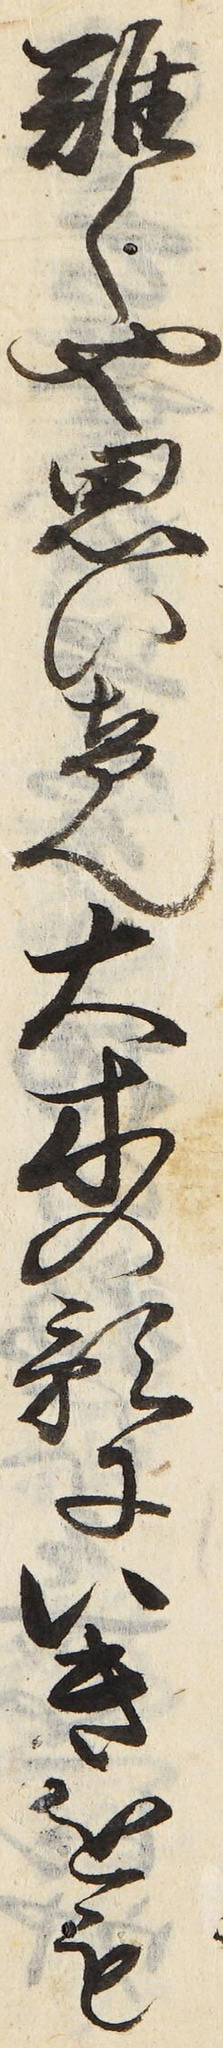難くや思ひけん大木の影にいきをも
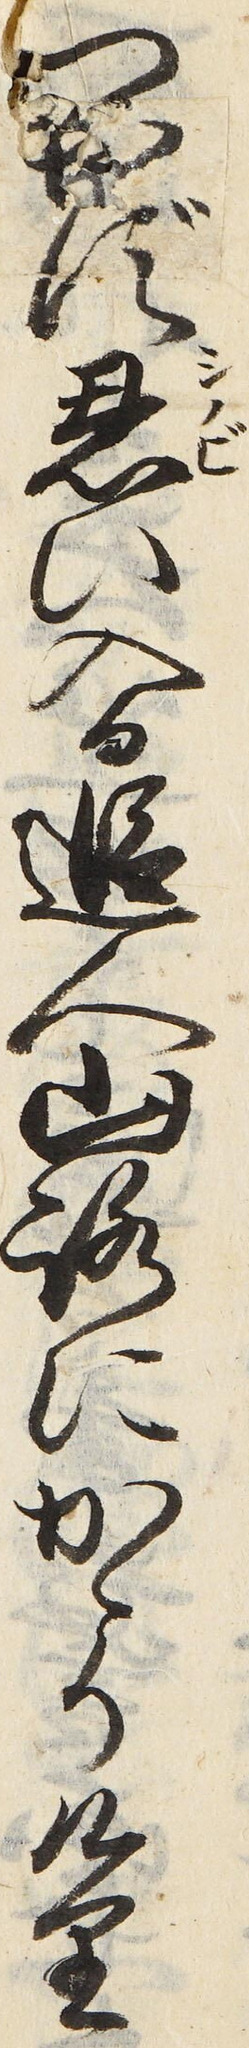つかず忍ひ入る追人山路にかゝりけり
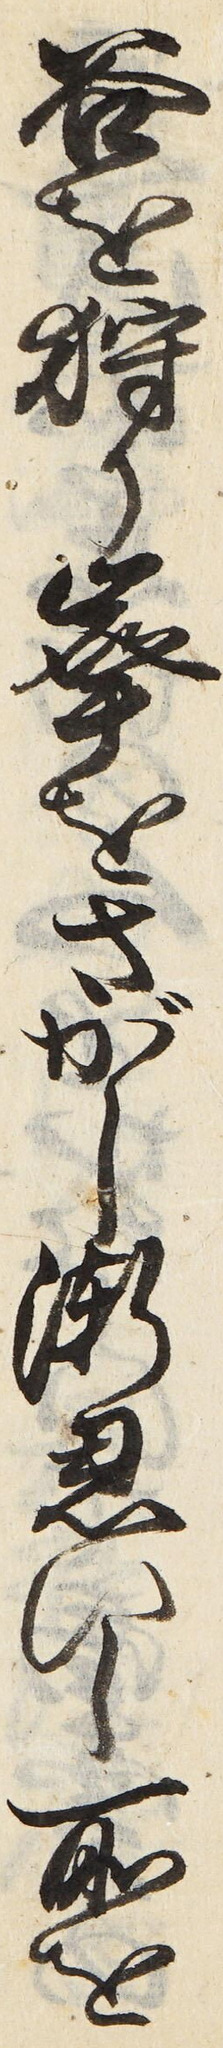谷を狩り峯をさがし漸思ひし所を
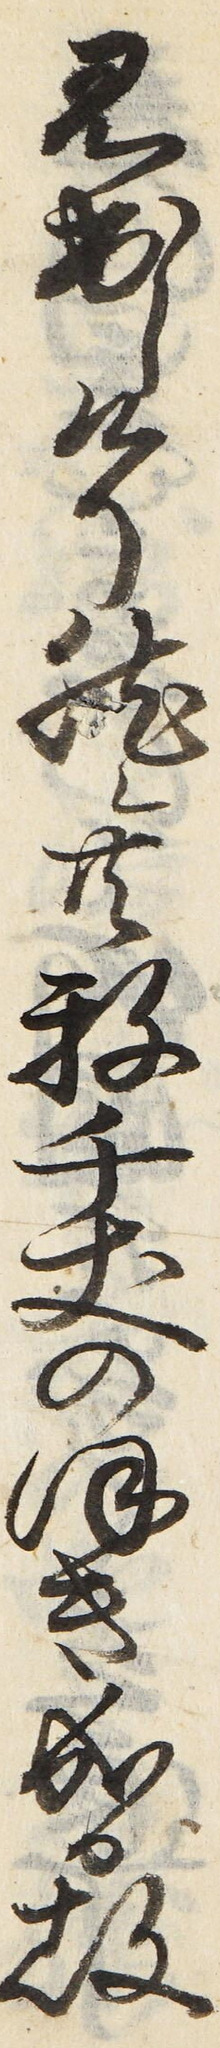見出しけり然れ共数千丈のほき成る故
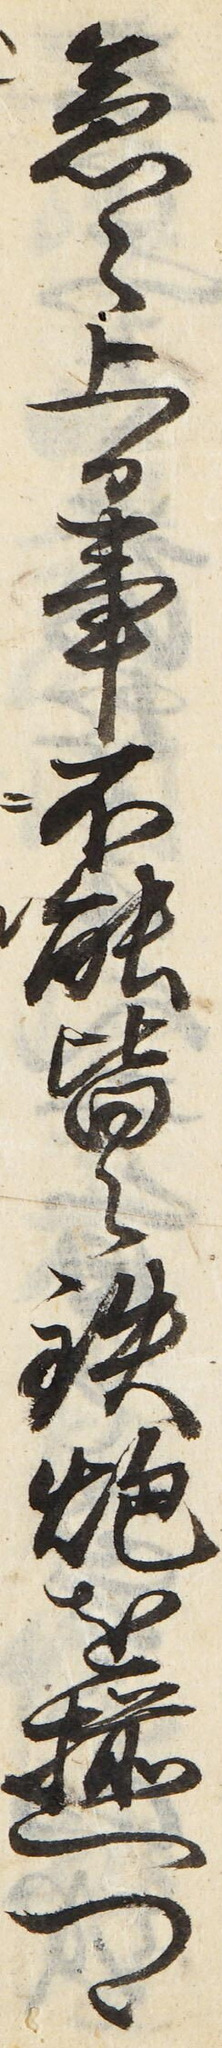急々上る事不能皆々鉄砲を揃へつゝ
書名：華夷九年録
